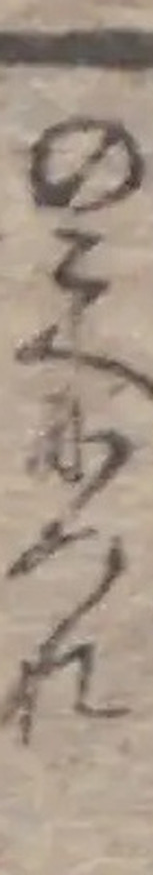のこへにつれ
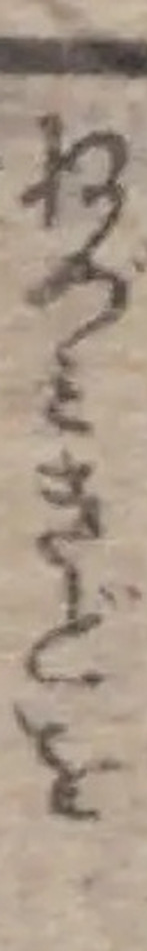ねづみきどを
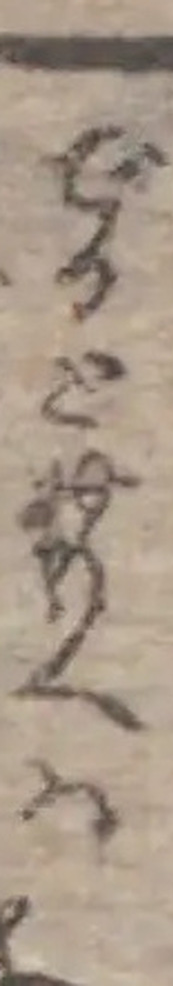でるとおもへは
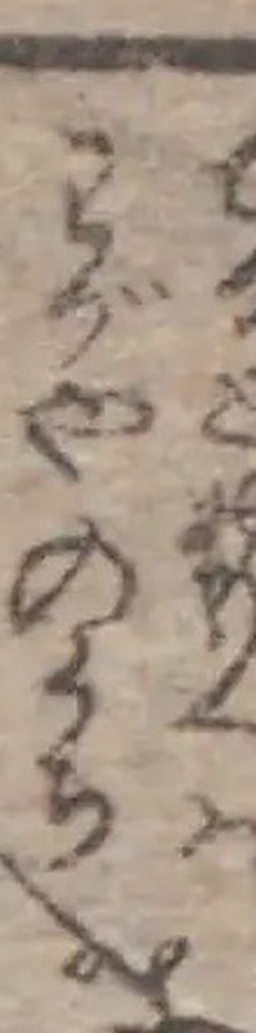わがやのくち
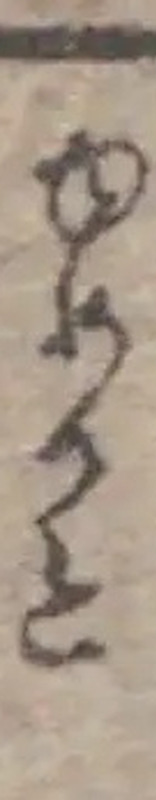ゆめかと
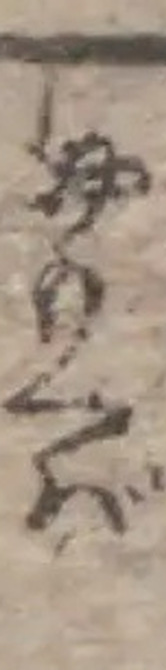おもへば
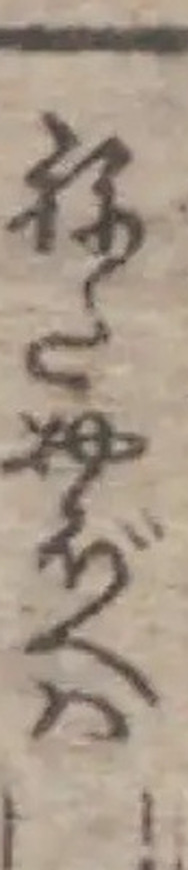ねたおぼえは
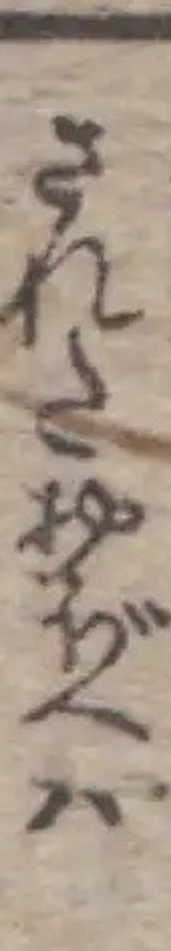されたおぼえは
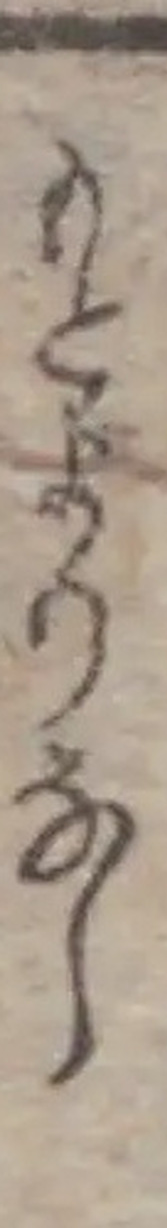もとよりなし
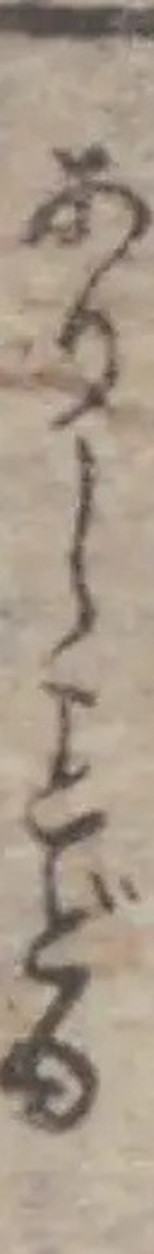ありしことども
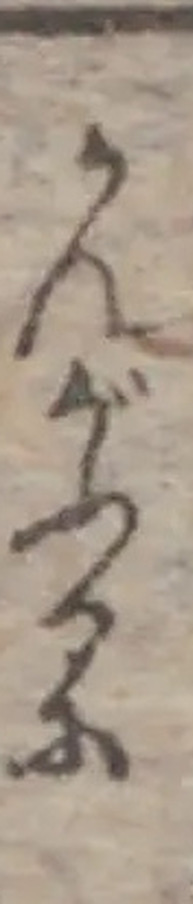かんがふるに
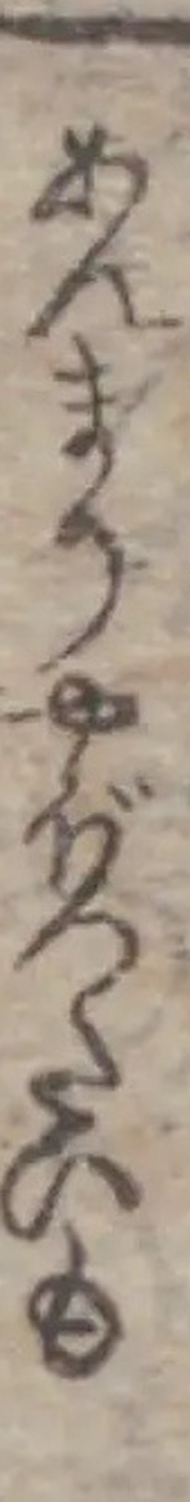あんまりやぼつたいも
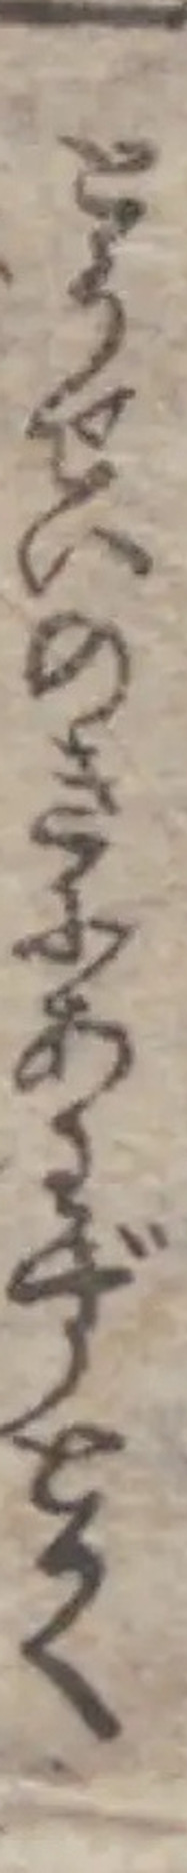とうせいのきにあわずとかく
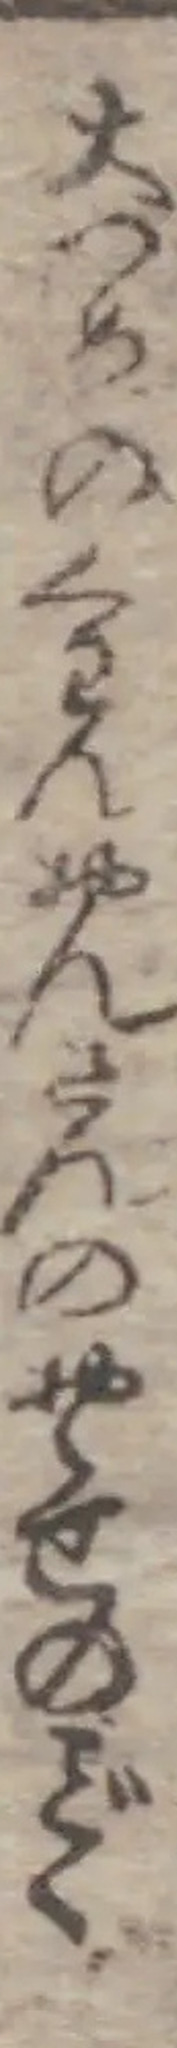大づめのくわんおんさんのおゝせのごとく
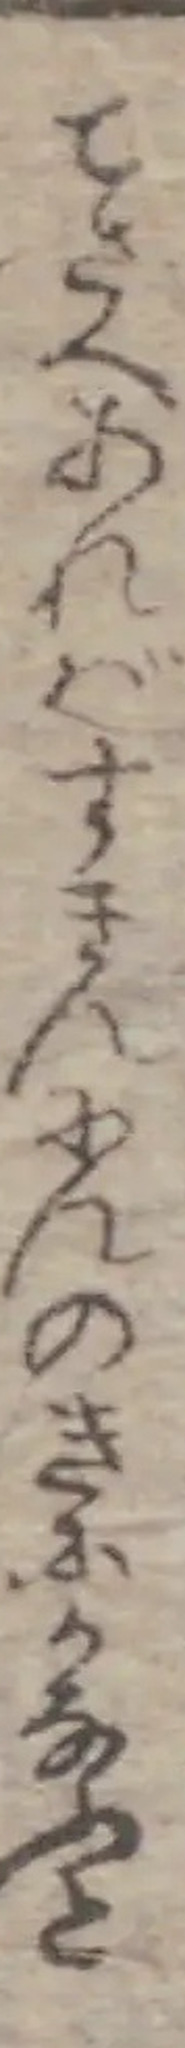てさへあればすきんにんのきにかなふと
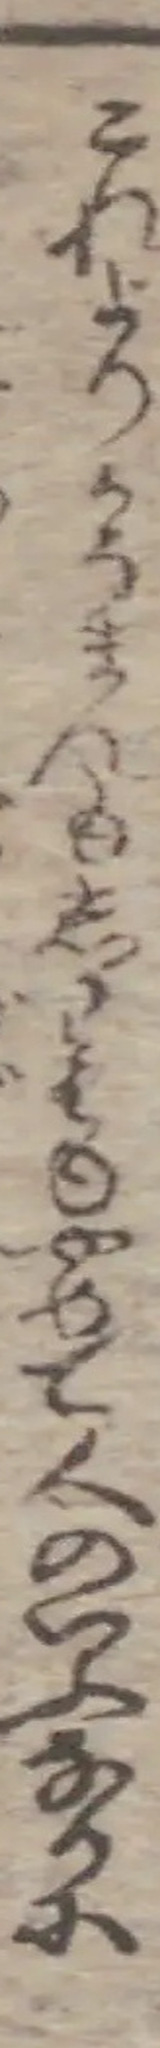これよりかうまんもしわしもやめて人のいふなかに
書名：富多高慢噺 3巻
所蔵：国立国会図書館 National Diet Library, JAPAN
